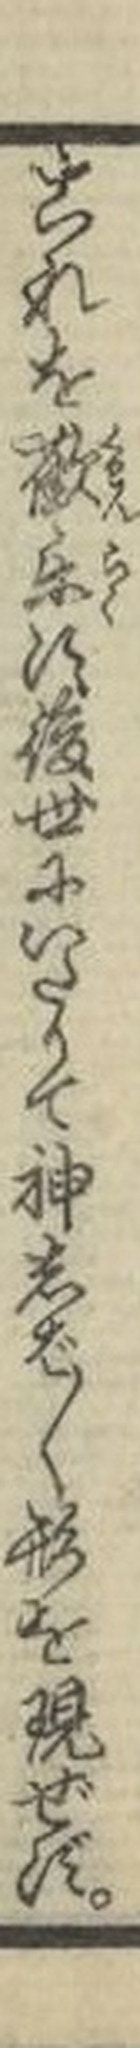これを歓楽す後世にいたりて神しば〳〵形を現ぜず。
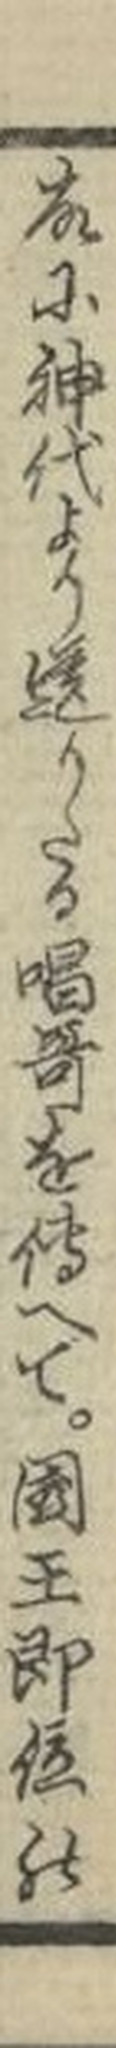故に神代より送りたる唱哥を伝へて。国王即位の
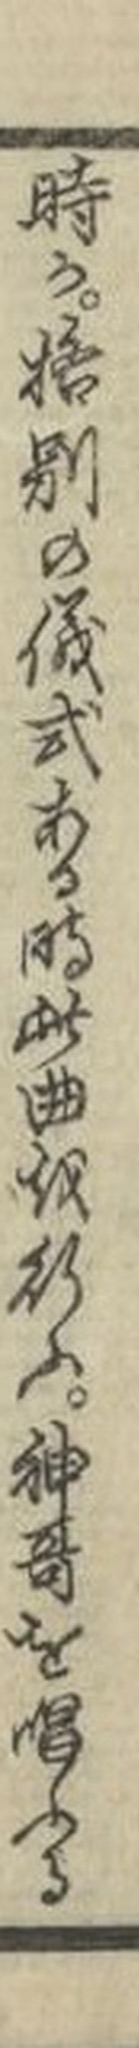時か。格別の儀式ある時此曲を行ふ。神哥を唱ふる
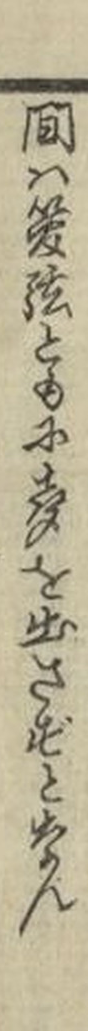間は管弦ともに声を出さずとなん
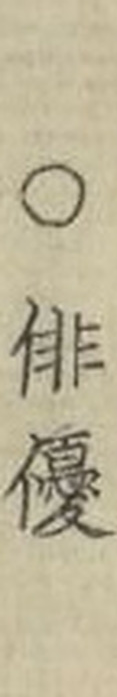○俳優
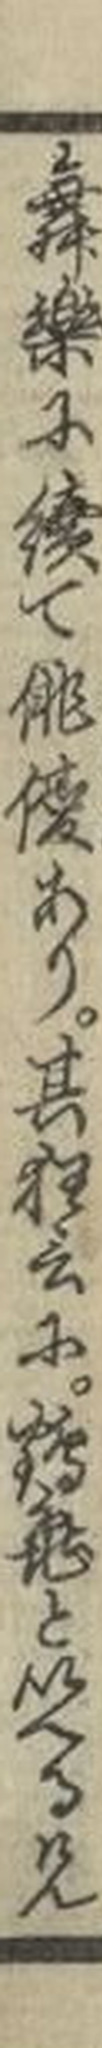舞楽に続て俳優あり。其狂言に。鶴亀といへる兄
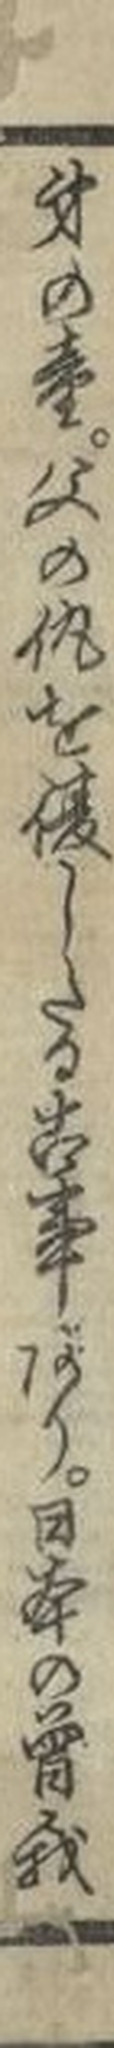弟の童。父の仇を復したる古事あり。日本の曽我

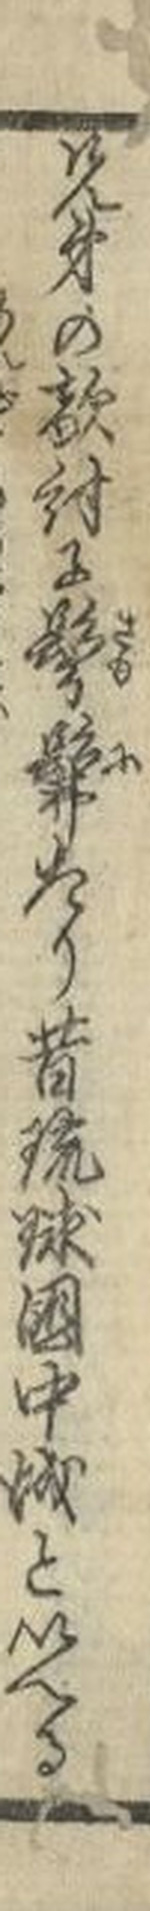兄弟の敵討に髣髴たり昔琉球国中城といへる
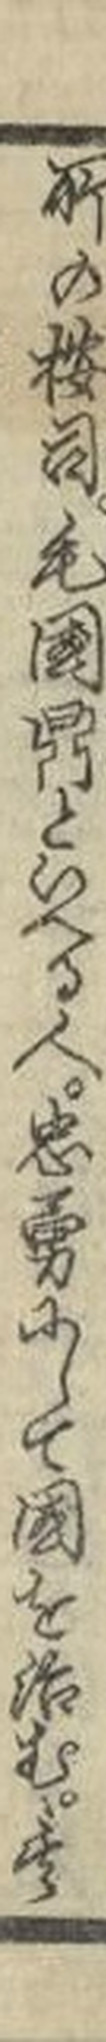所の按司。毛国鼎といへる人。忠勇にして国を治む。其
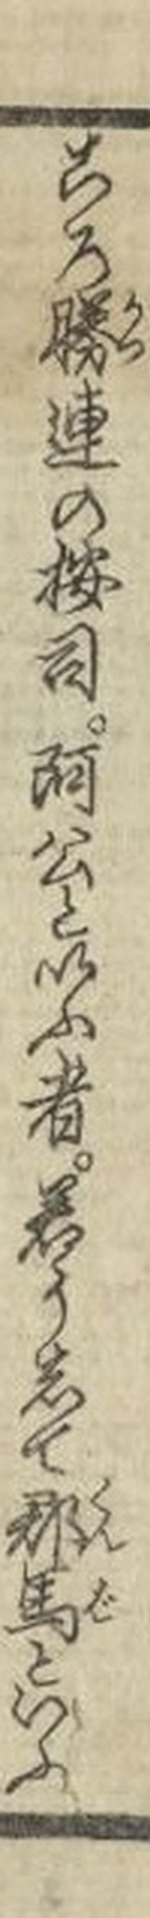ころ勝連の按司。阿公といふ者。若うして郡馬といふ
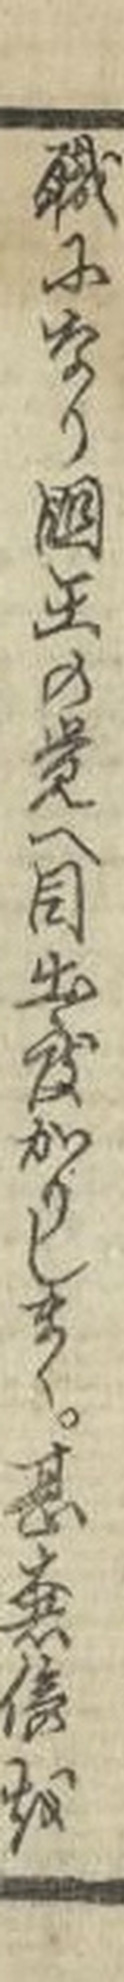職になり国王の覚へ目出度かりしまゝ。其奢侈を
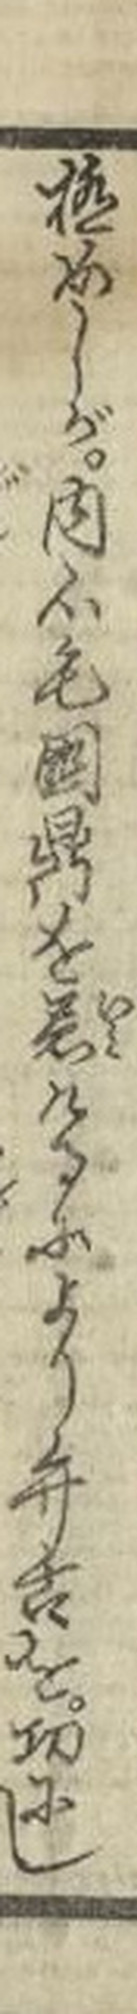極めしが。内心毛国鼎を忌けるにより弁舌を。功にし
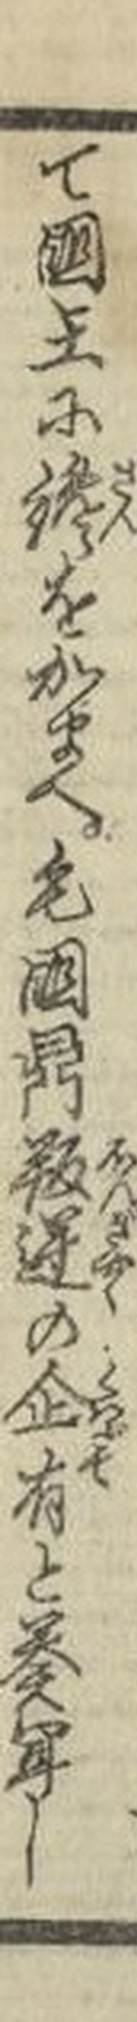て国王に讒をかまへ。毛国鼎叛逆の企有と奏聞し
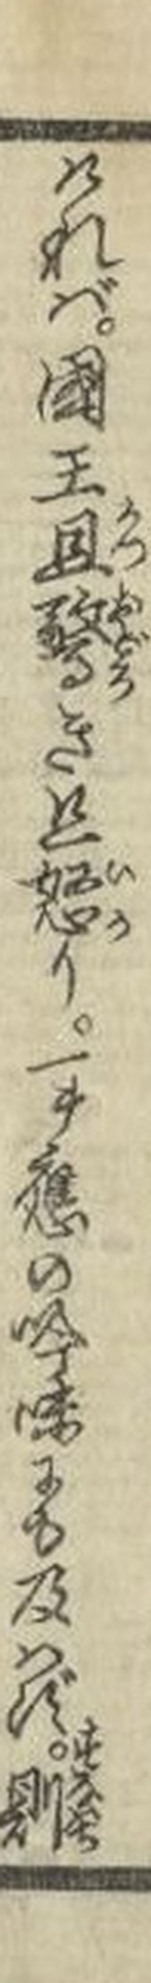ければ。国王且驚き且怒り。一チ応の吟味にも及はず。則
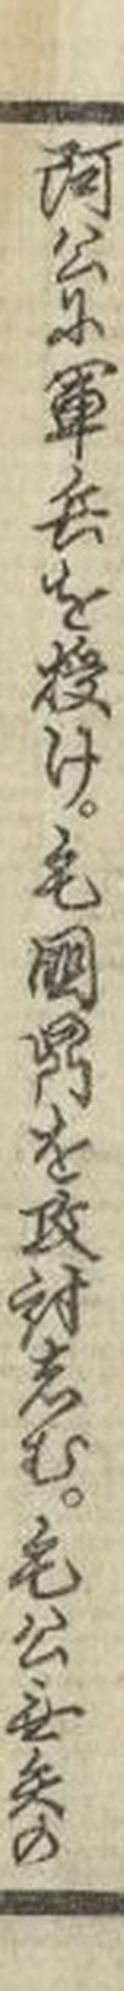阿公に軍兵を授け。毛国鼎を攻討しむ。毛公無矢の
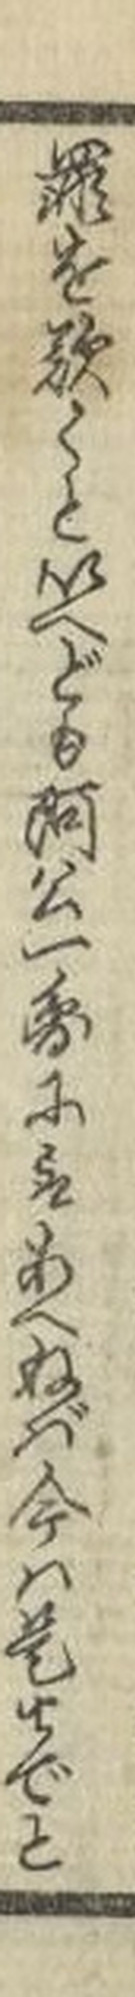罪を歎くといへども阿公一円に取あへねば今は是までと
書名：琉球解語
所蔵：University of the Ryukyus Library
